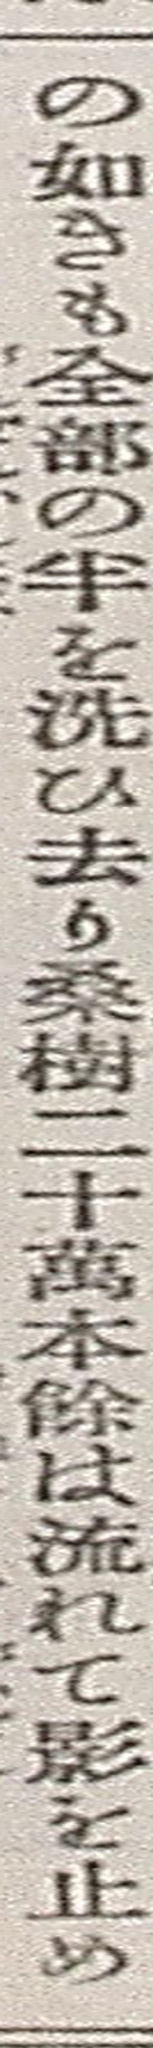の如きも全部の半を洗ひ去り桑樹二十万本餘は流れて影を止め
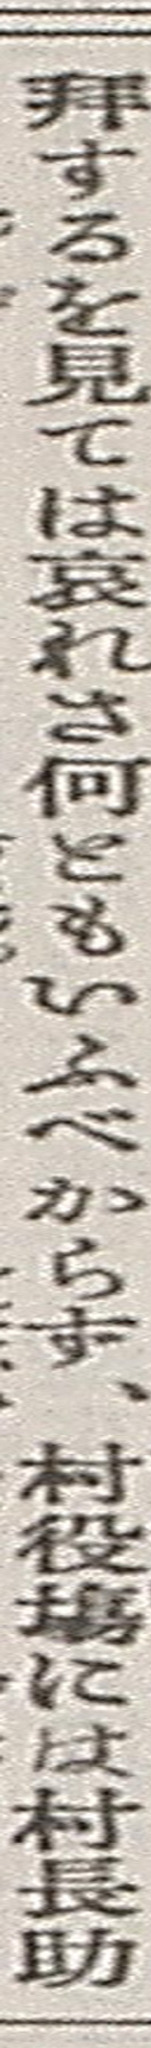拝するを見ては哀れさ何ともいふべからず、村役場には村長助
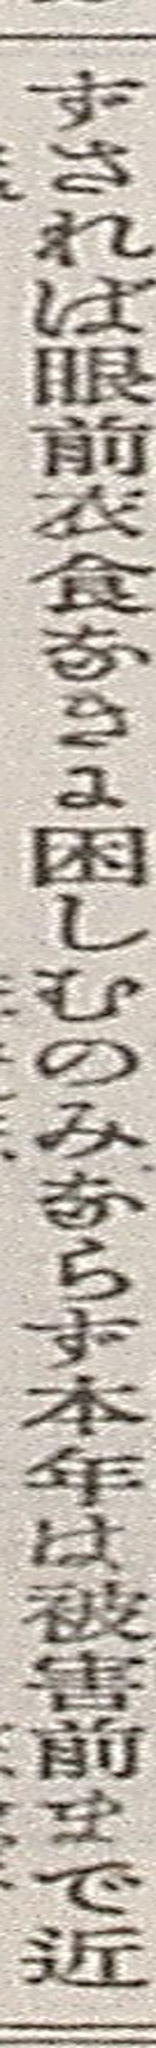ずされば眼前衣食なきに困しむのみならず本年は被害前まで近
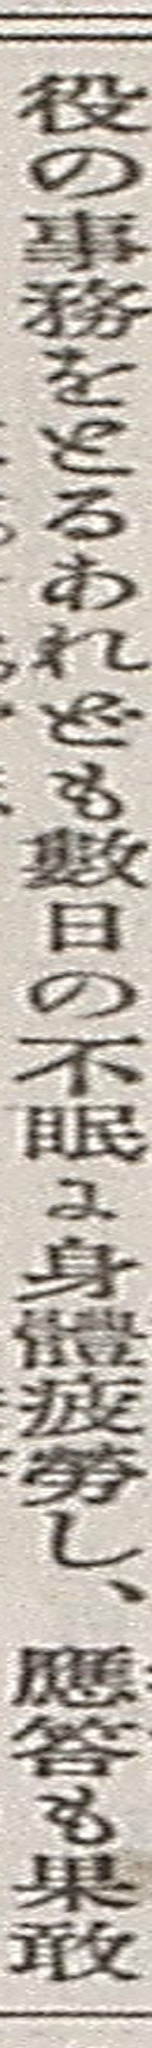役の事務をとるあれども数日の不眠に身体疲労し、応答も果敢
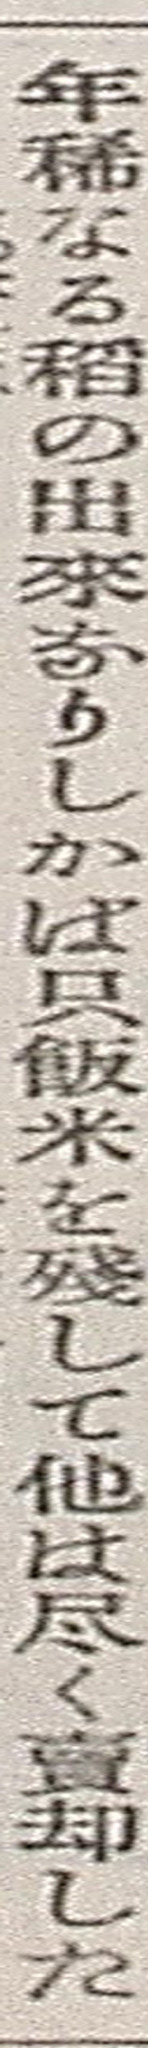年希なる稲の出来なりしかば只飯米を残して他は尽く売却した
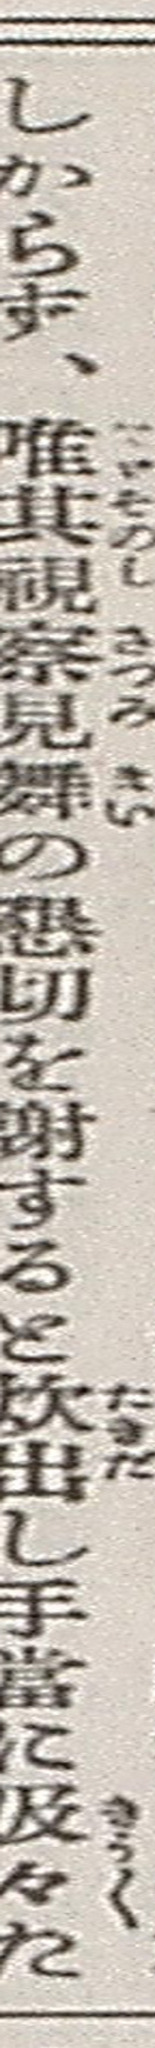しからず、唯其視察見舞の懇切を謝すると炊出し手当に汲々た
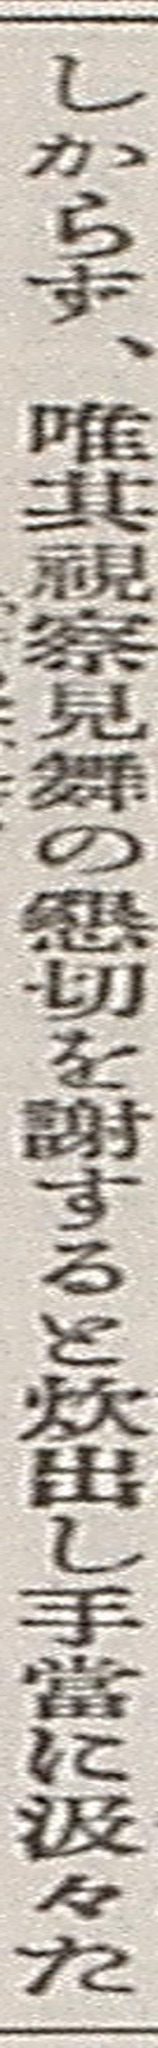しからず、唯其視察見舞の懇切を謝すると炊出し手当に汲々た
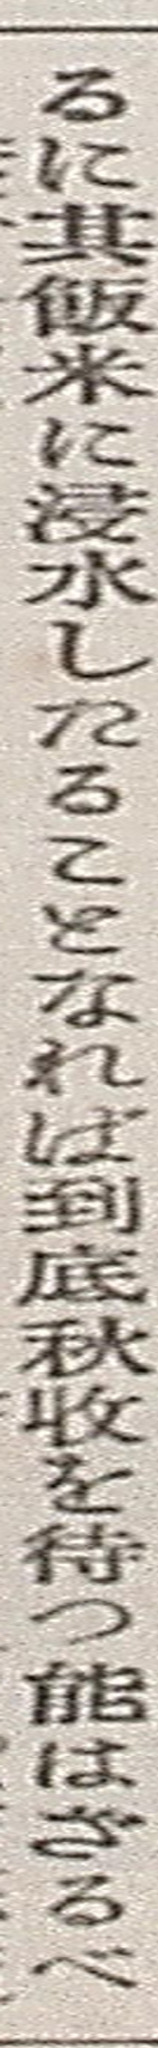るに其飯米に浸水したることなれば到底秋収を待つ能はざるべ
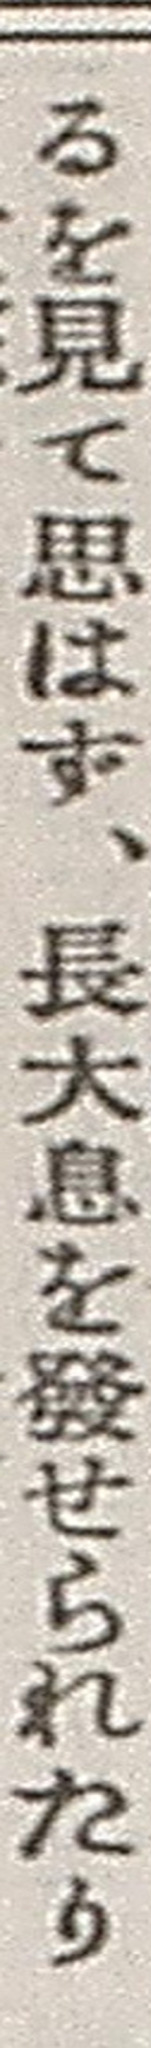るを見て思はず、長大息を発せられたり
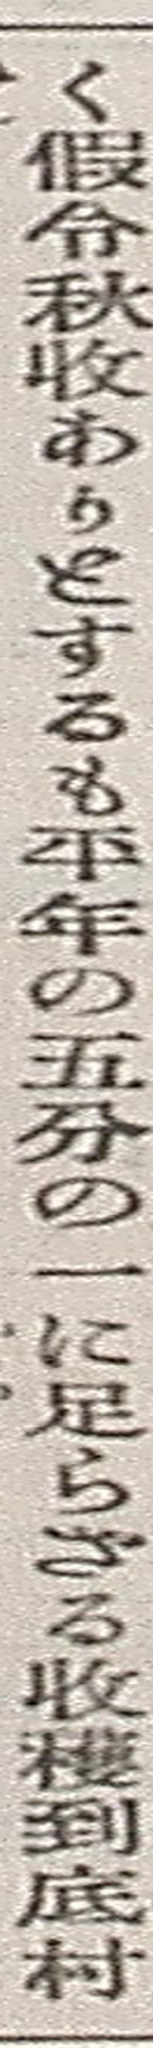く仮令秋収ありとするも平年の五分の一に足らざる収穫到底村
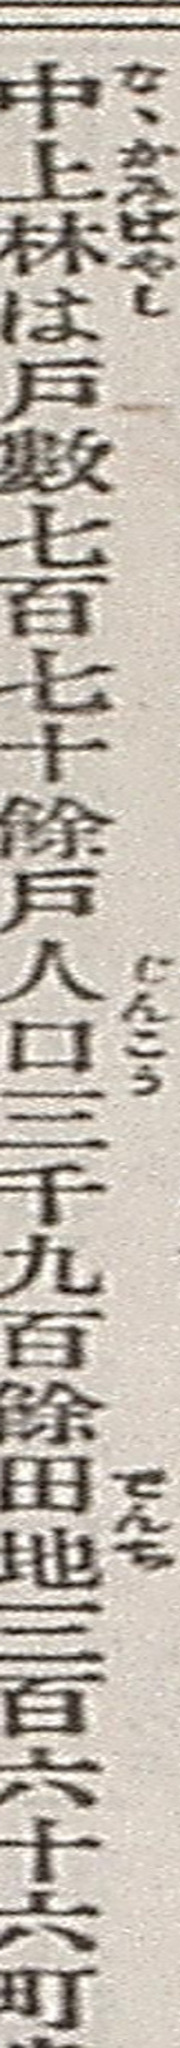中上林は戸数七百七十餘戸人口三千九百餘田地三百六十六町歩
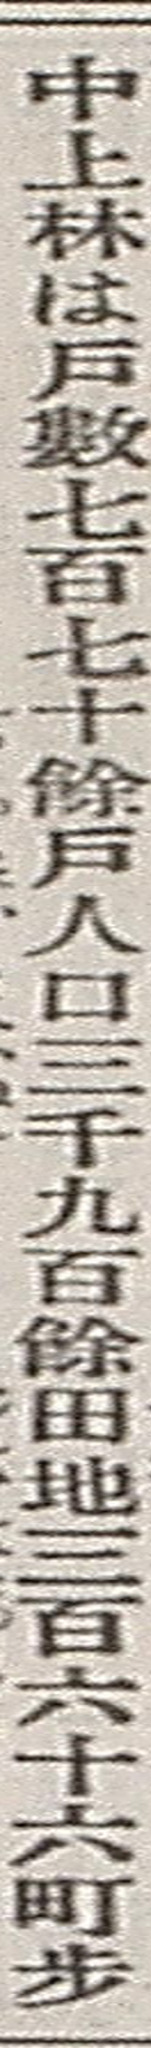中上林は戸数七百七十餘戸人口三千九百餘田地三百六十六町歩
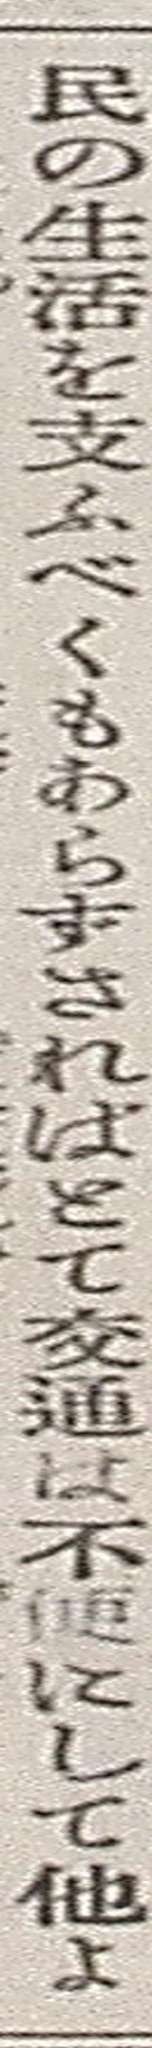民の生活を支ふべくもあらずさればとて交通は不便にして他よ
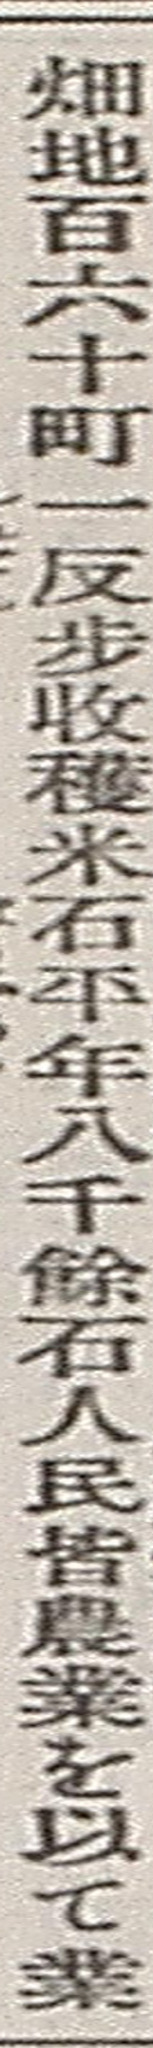畑地百六十町一反歩収穫米石平年八千餘石人民皆農業を以て業
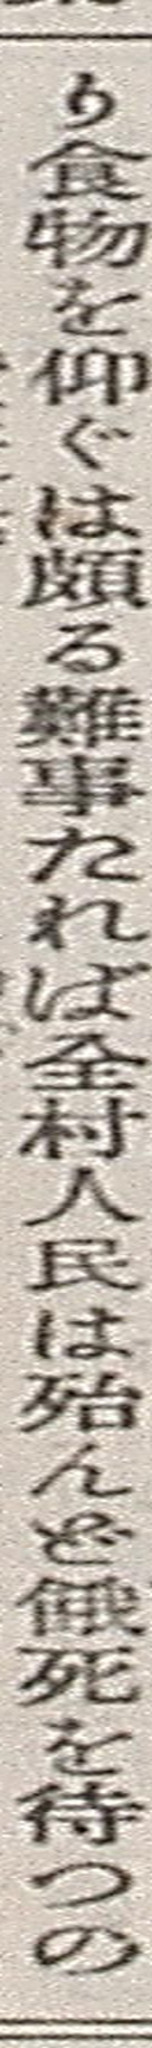り食物を仰ぐは頗る難事たれば全村人民は殆んど餓死を待つの
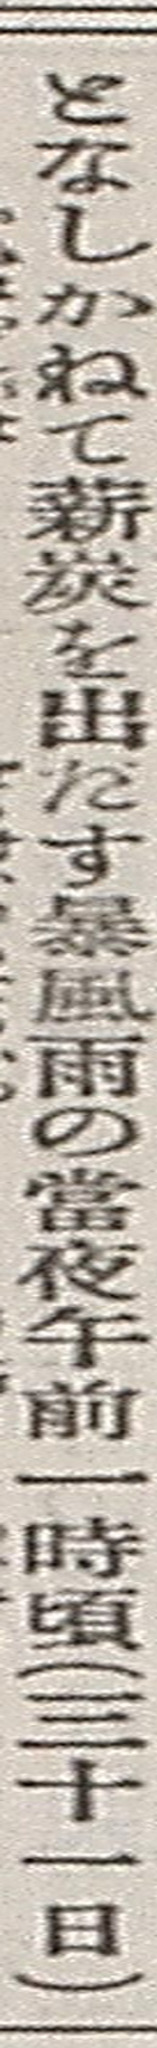となしかねて薪炭を出だす暴風雨の当夜午前一時頃
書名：風俗畫報臨時増刊第百二十八號　洪水被害録（下）
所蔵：東京大学地震研究所図書室 Earthquake Research Institute Library, The University of Tokyo, JAPAN
